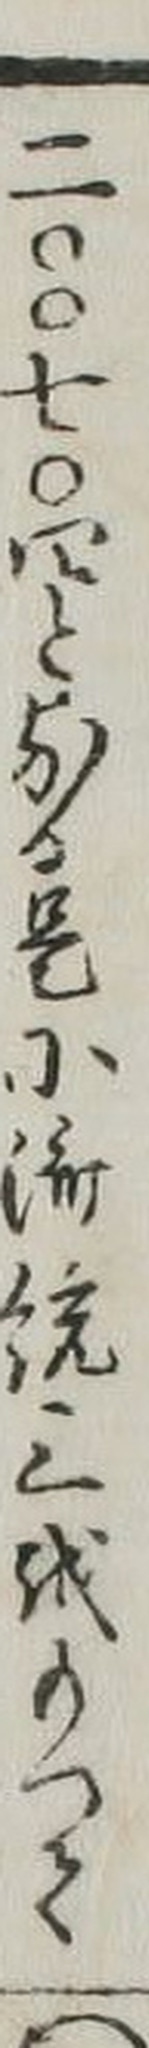二〇〇七〇四となる是に済統三をもつて
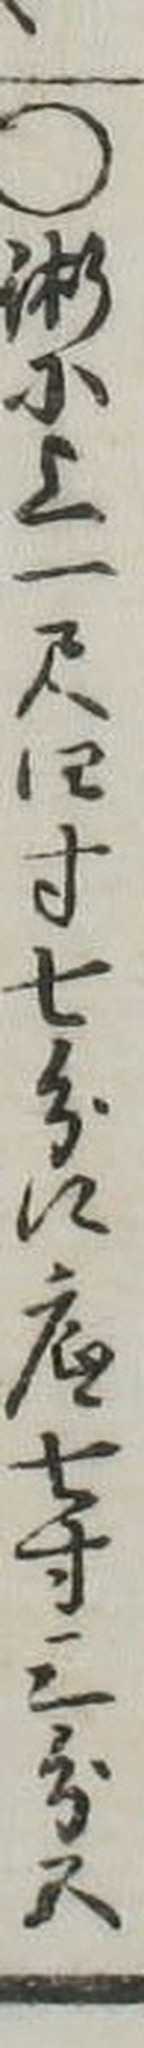○術に上一尺四寸七分に底七寸三分五
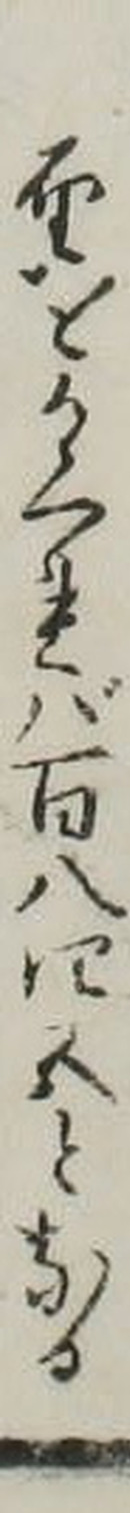四三厘をかくれば百八四五となる
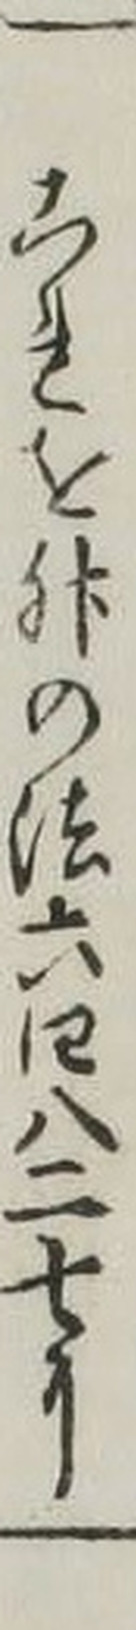寸これを升の法六四八二七に
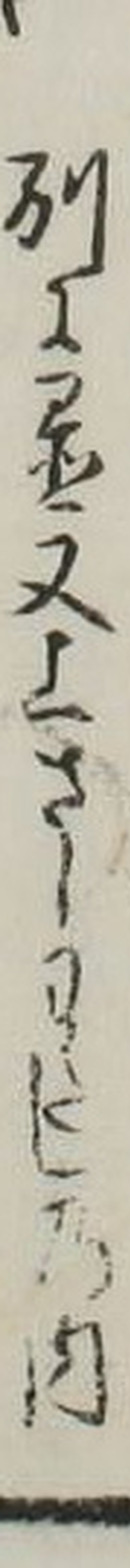寸分別に置又上さしわたしの内
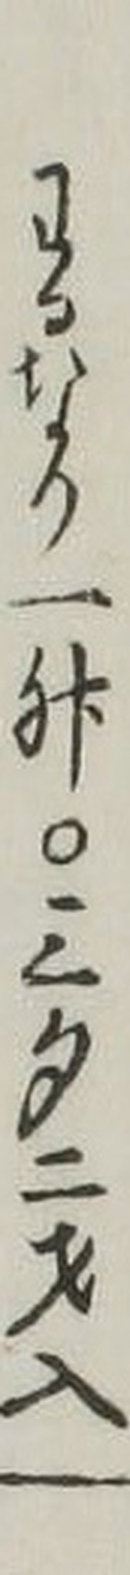六わるなり一升〇三勺二才入
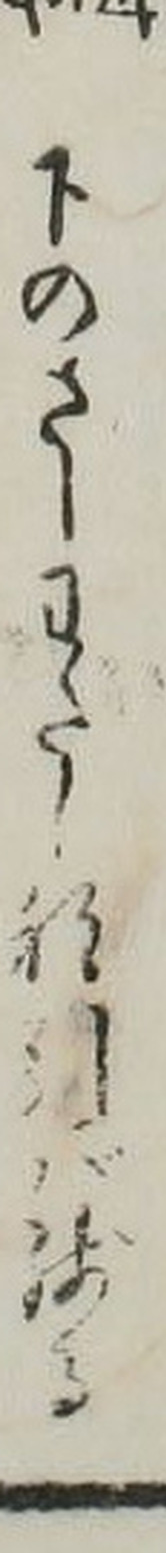七五下のさしわたし程引ば残る
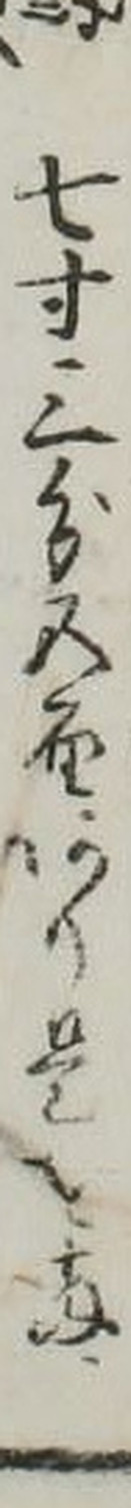分リ七寸三分五厘あり是を両に
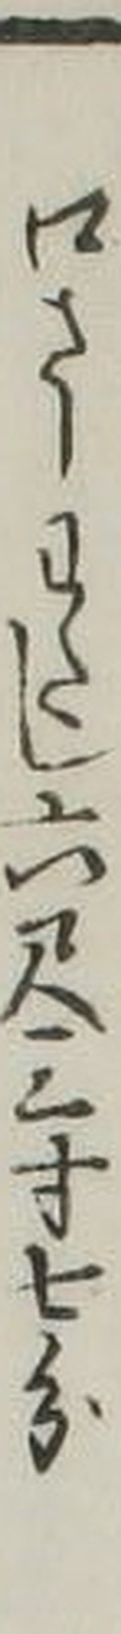口さしわたし六尺三寸七分
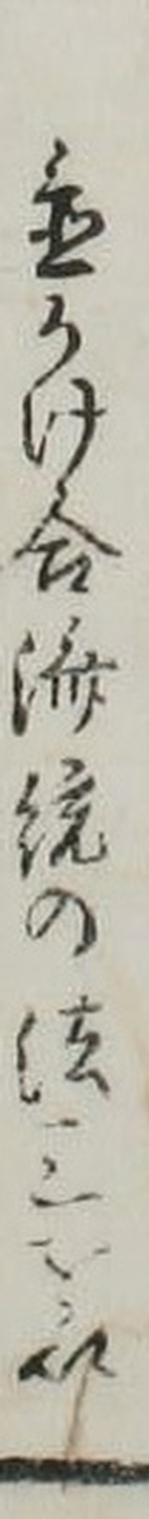ン置かけ合済統の法三を以
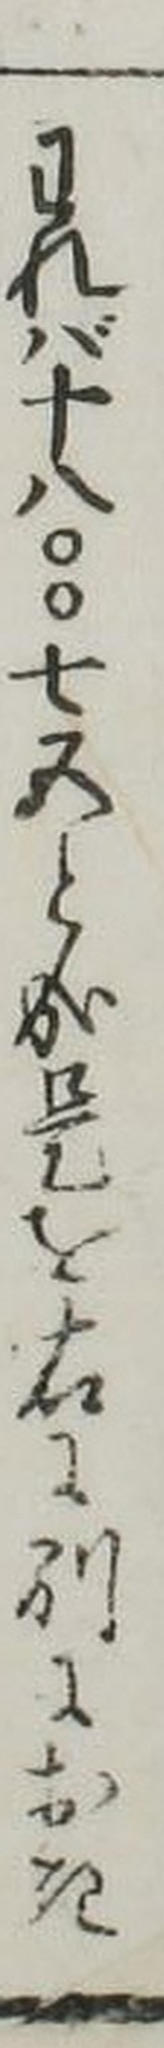われば十八〇〇七五と成是を右に別におき
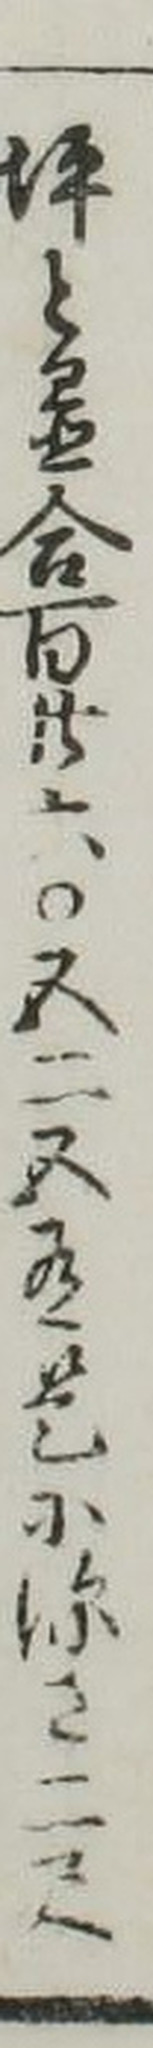坪と置合百廿六〇五二五有是に深さ二尺
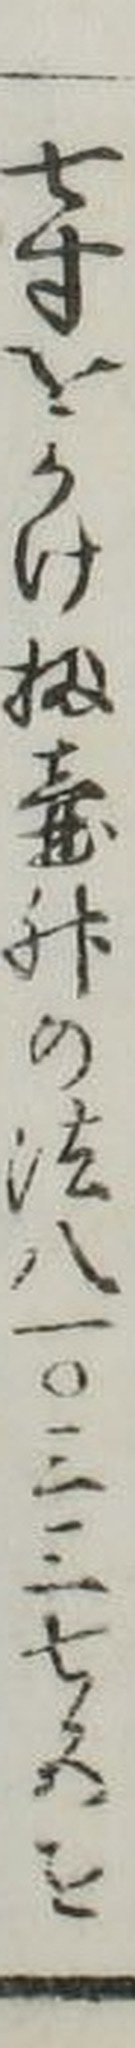七寸をかけ扨壺升の法八一〇三三七五を
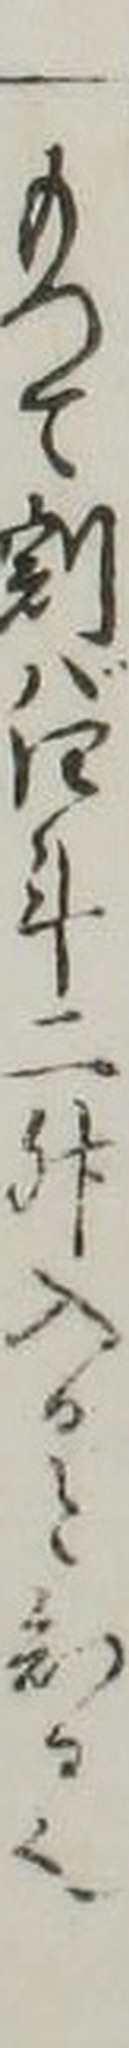もつて割ば四斗二升入ると知る也
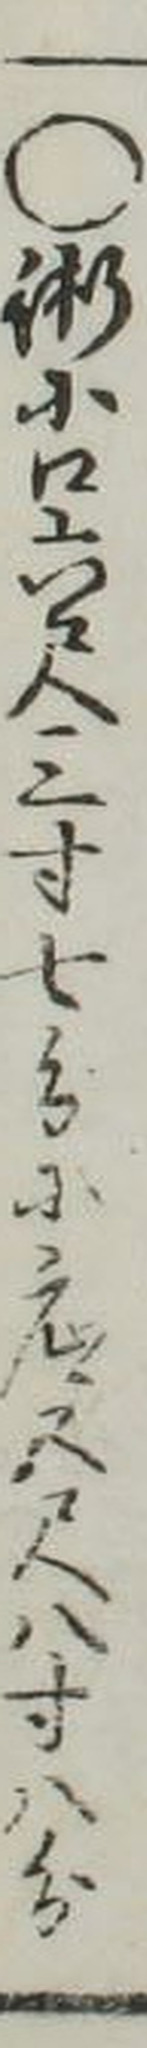○術に口六尺三寸七分に底五尺八寸八分
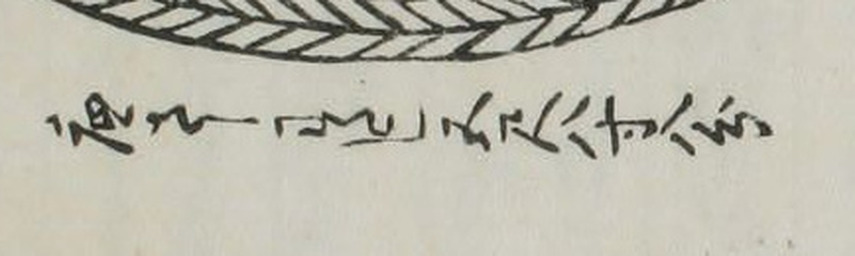口さしわたし六尺三寸七分
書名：宝玉塵劫記
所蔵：東京学芸大学教育コンテンツアーカイブ
